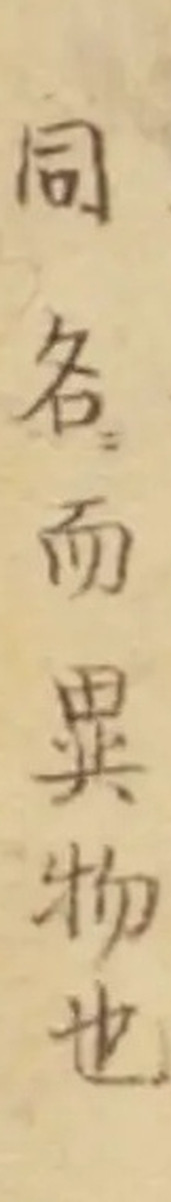同名ニ而異物也

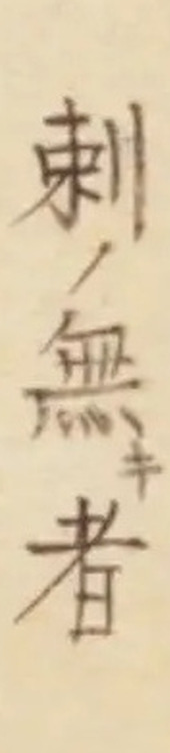刺ノ無キ者
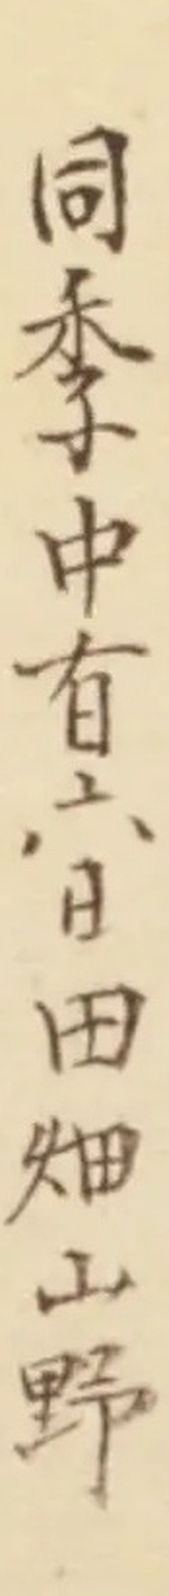同季中有六日田畑山野
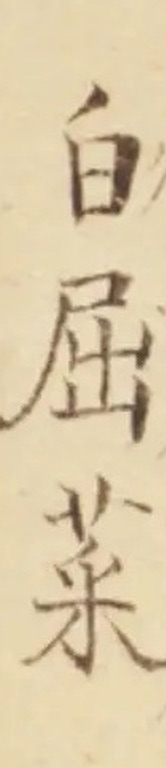白屈菜
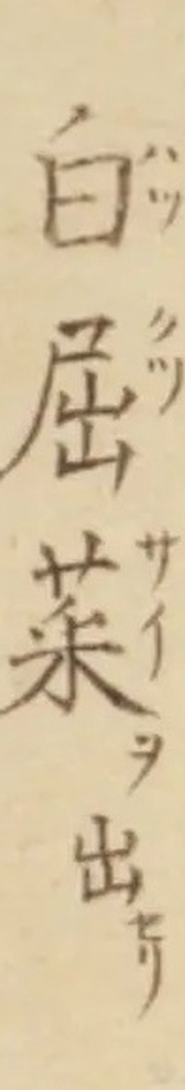白屈菜ヲ出セリ
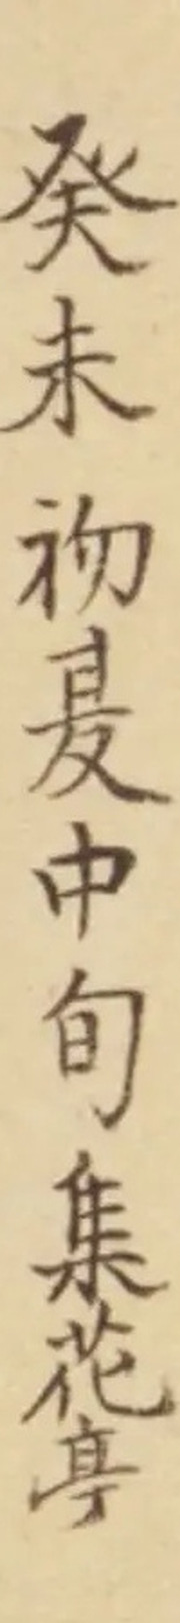癸未初夏中旬集花亭
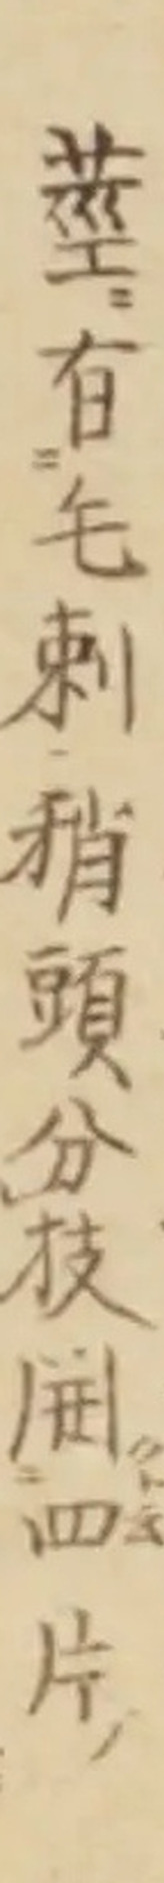莖ニ有毛刺稍頭分枝開クト云四片ノ
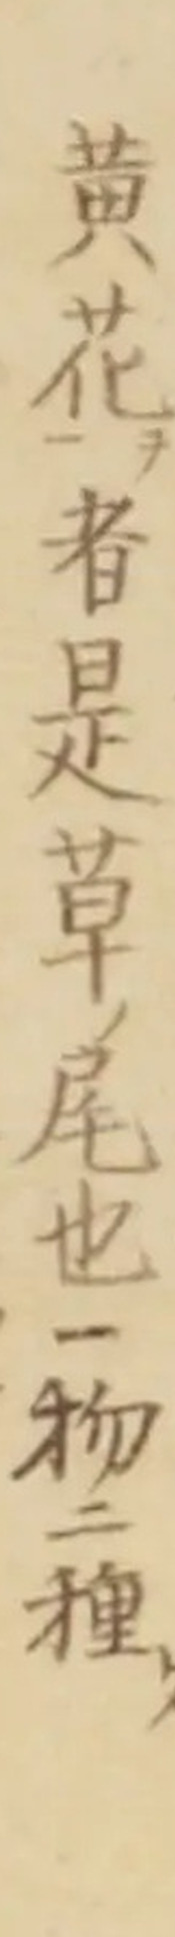黄花ヲ者也是草の尾也一物二種トメ
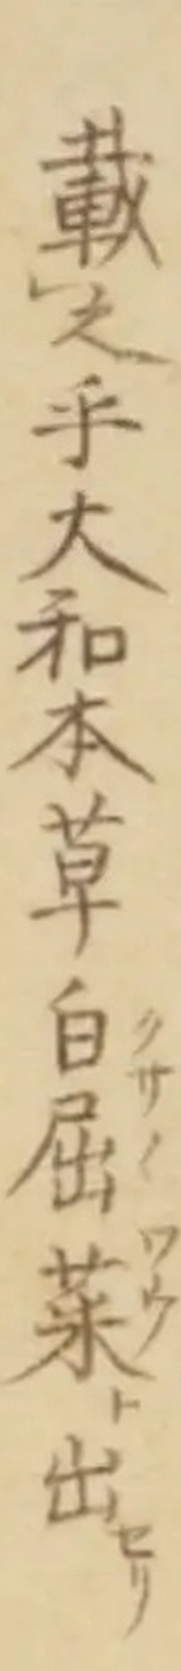載之乎大和本草白屈菜ト出セリ

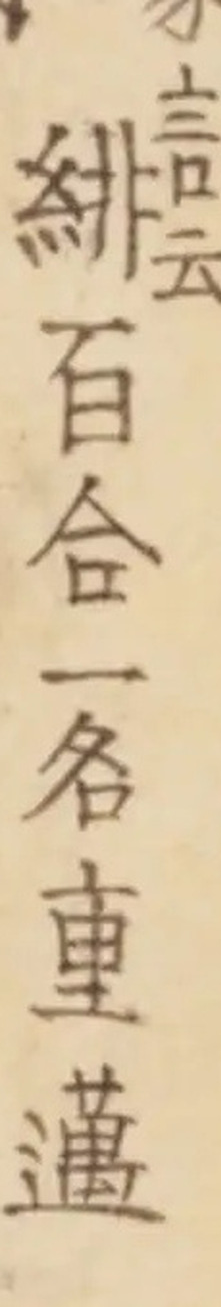山丹緋百合一名重邁
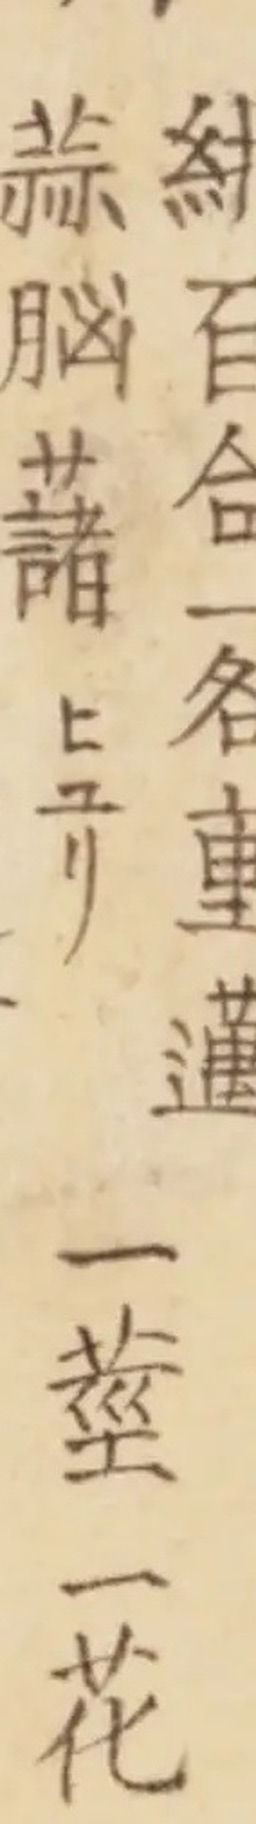蒜甘藷ヒユリ一莖一花
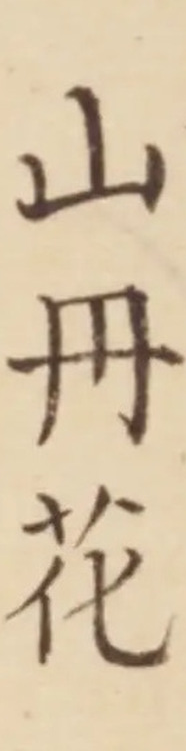山丹花
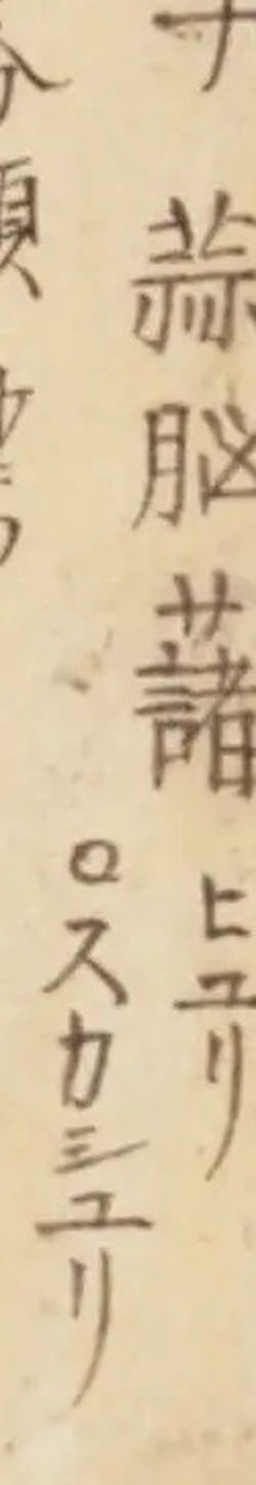〇スカシユリ
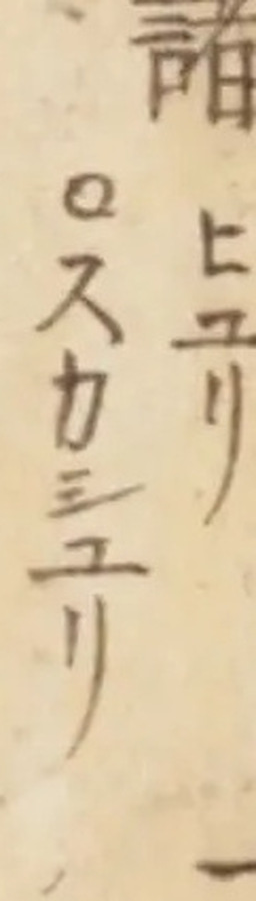〇スカシユリ
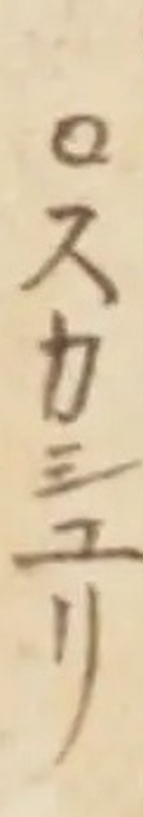〇スカシユリ
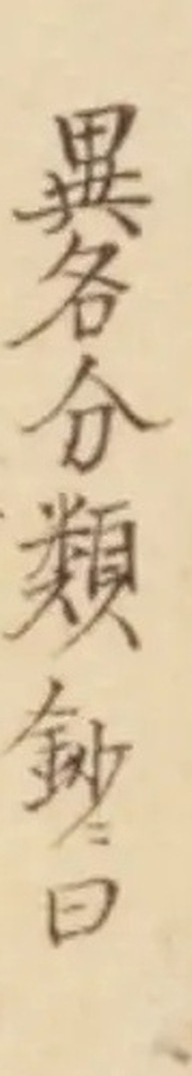異名分類抄ニ曰
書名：梅園草木花譜夏之部. 1
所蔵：国立国会図書館 National Diet Library, JAPAN
